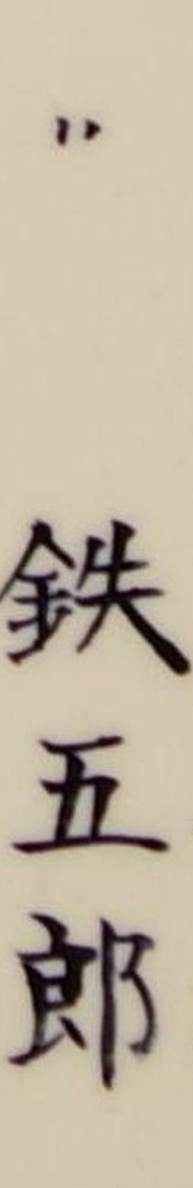鉄五郎
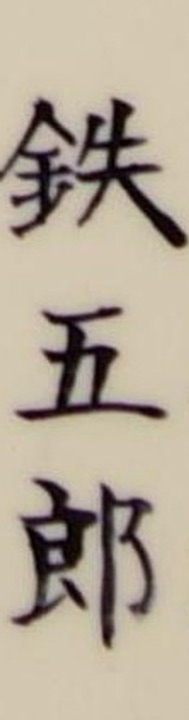鉄五郎
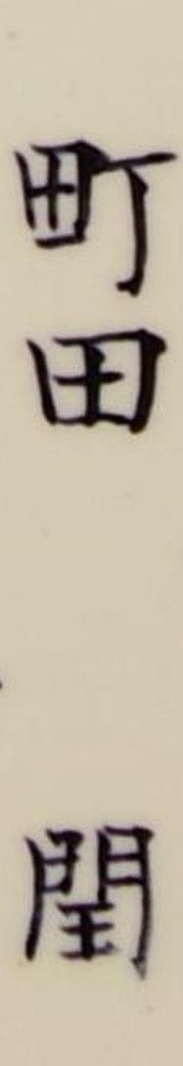町田閏
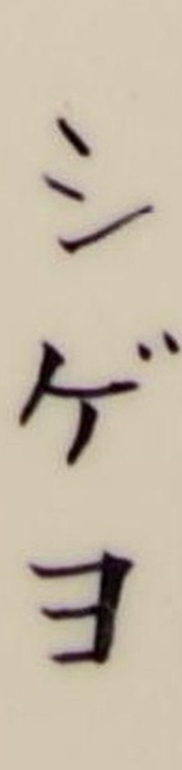シゲヨ
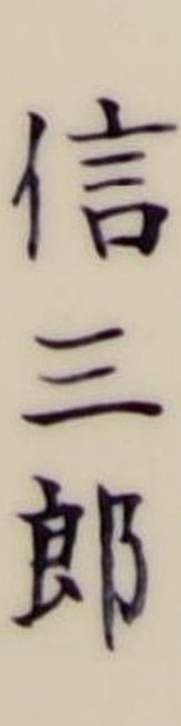信三郎
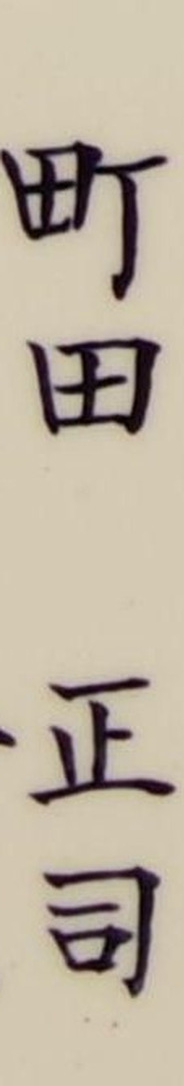町田正司
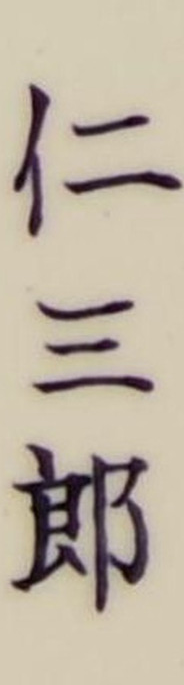仁三郎

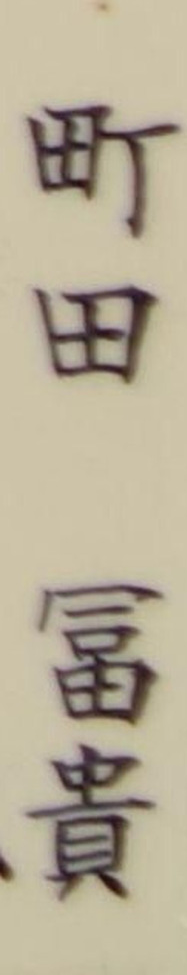町田富貴
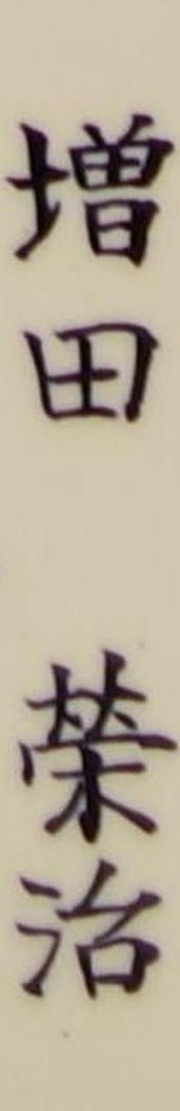増田榮治
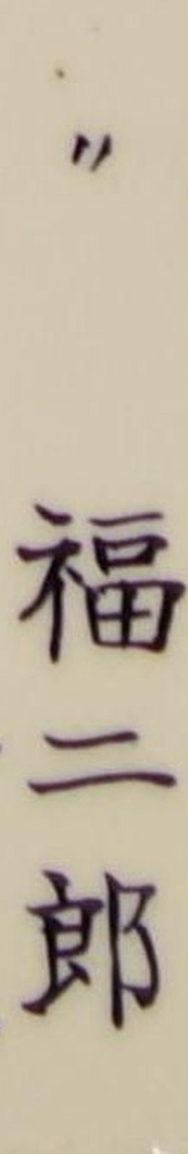福二郎
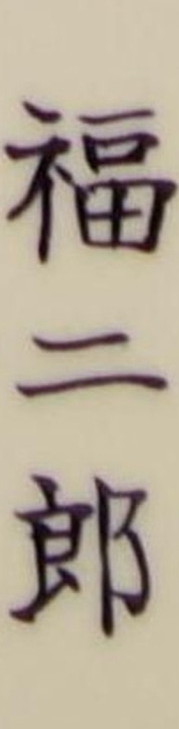福二郎
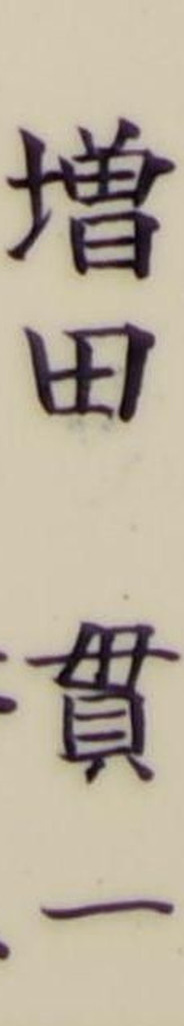増田貫一

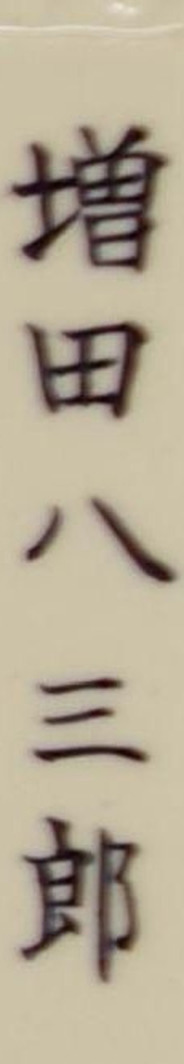増田八三郎
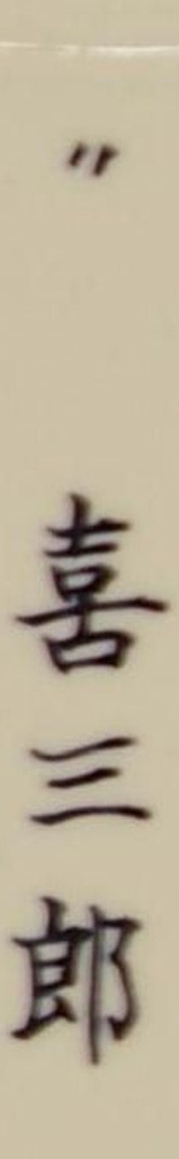喜三郎
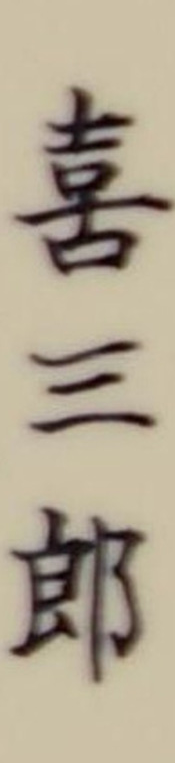喜三郎
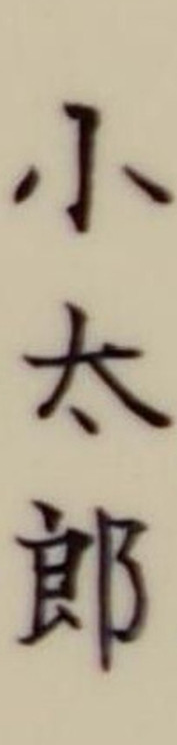小太郎
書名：A~D
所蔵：koyasan kongobuji
